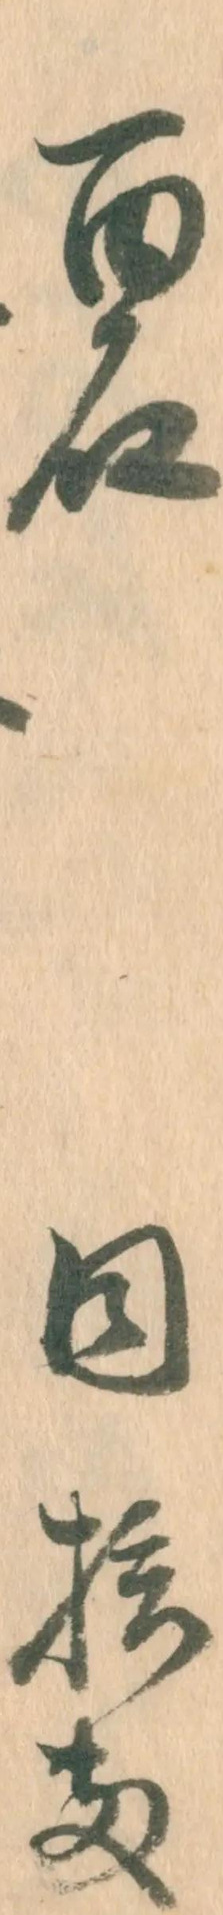百石同拾両
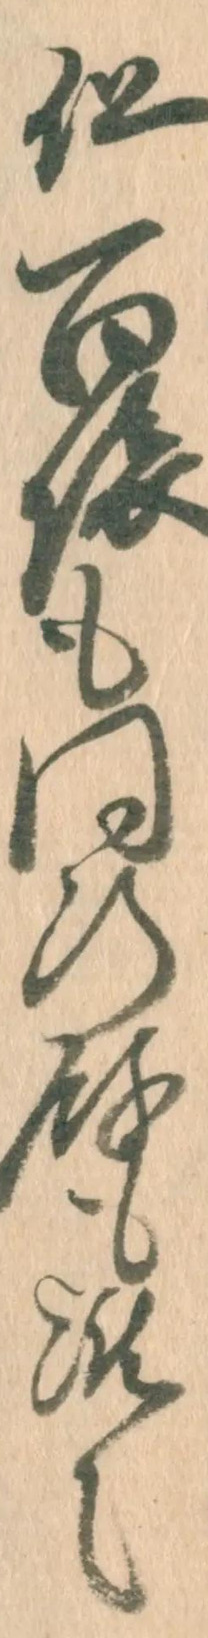但百俵も同断余も准之
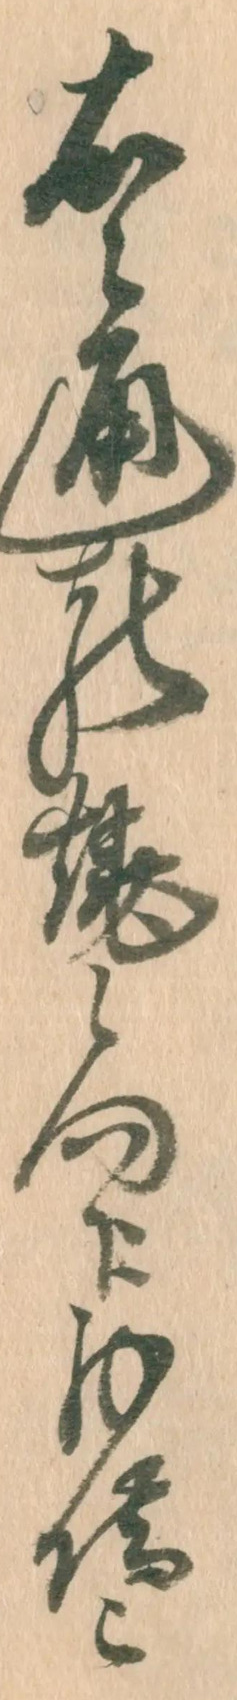右之通類焼之向え拝借被
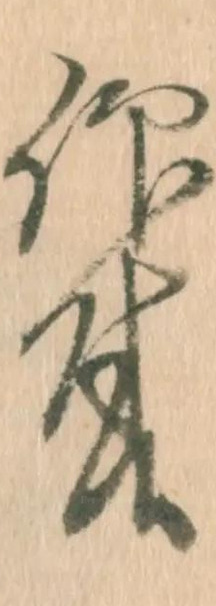仰付候

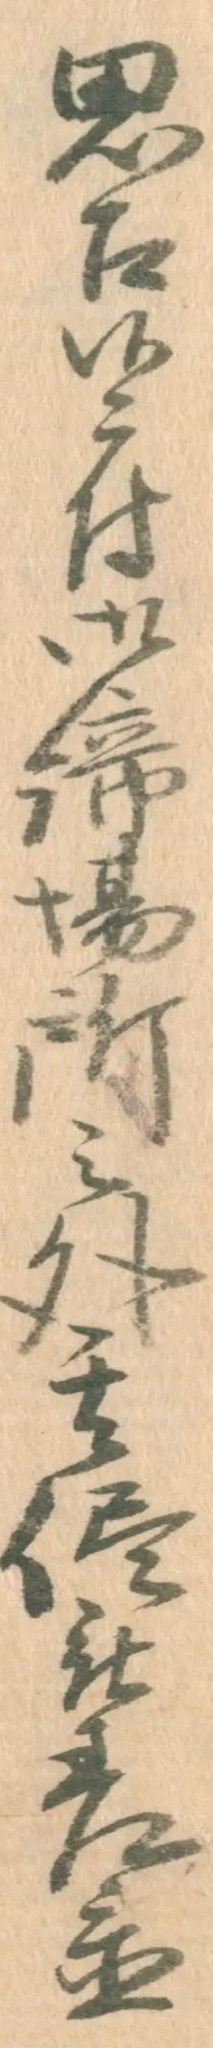思召候ニ付御諦場所之外其儘被差置
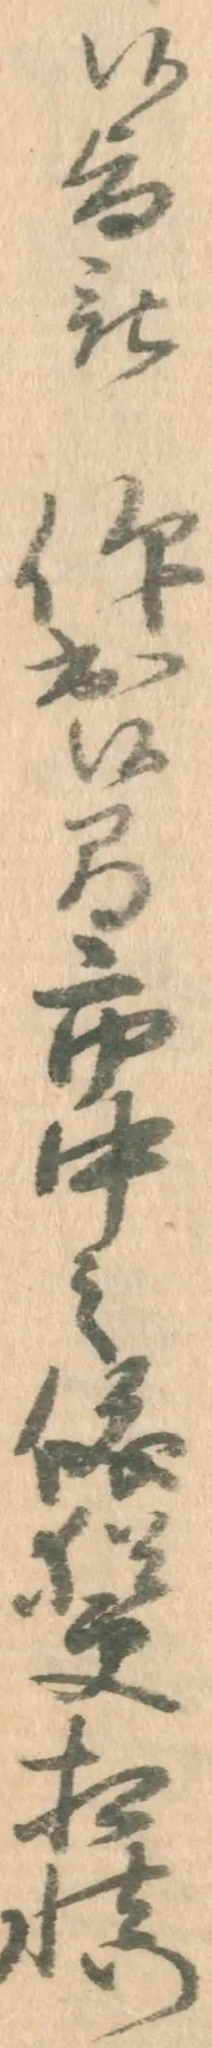候旨被仰出候間市中之儀猶更相慎
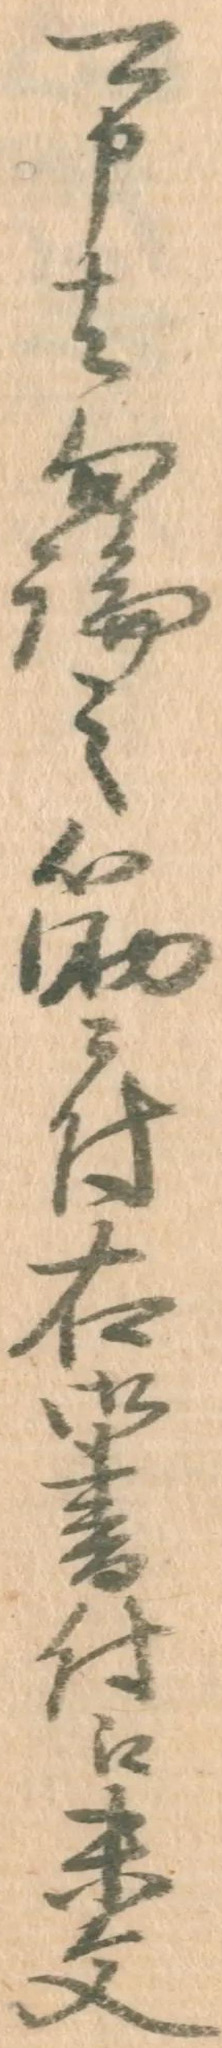可申は勿論之筋ニ付、右御書付え末文
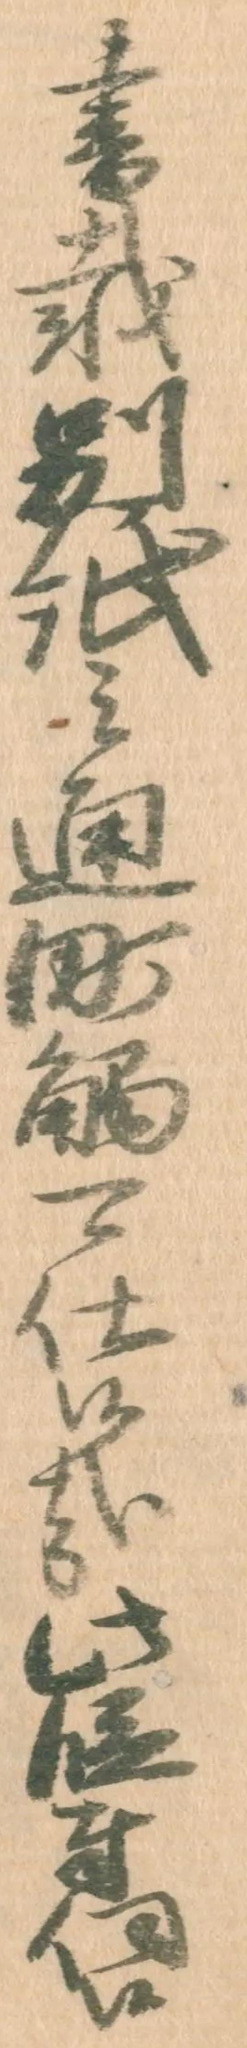書載別紙之通町触可仕候哉此段奉伺候
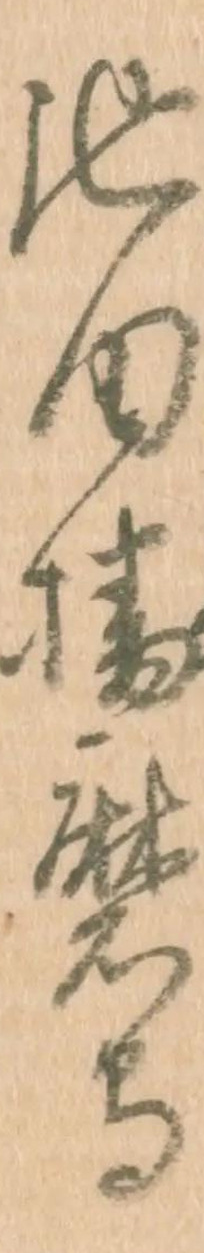池田播磨守
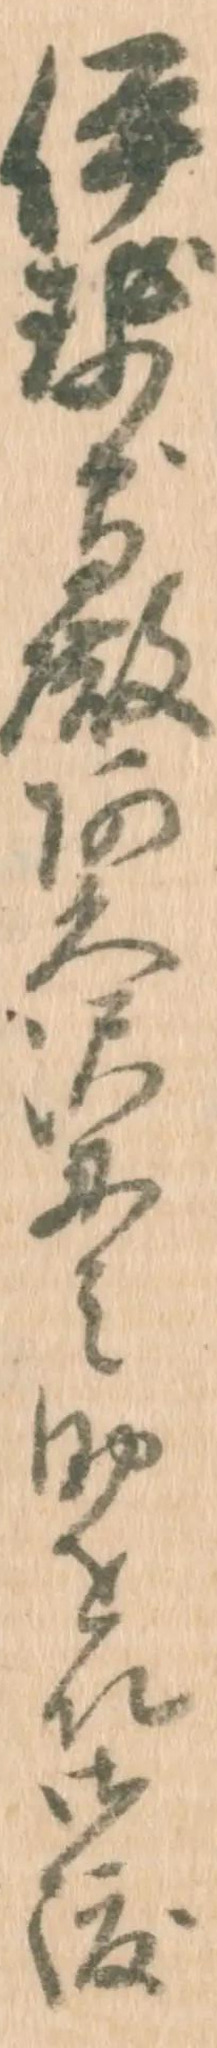伊㔟守殿阿久沢丑之助を以御渡
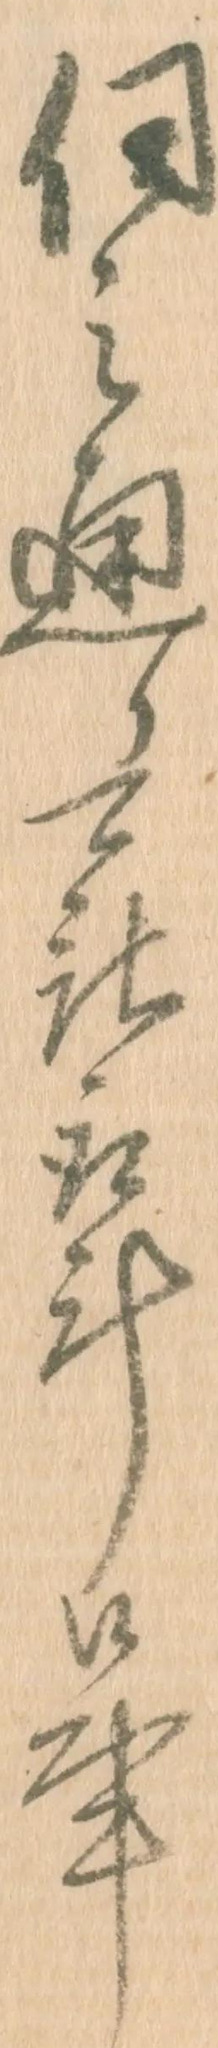伺之通り可被取計候事

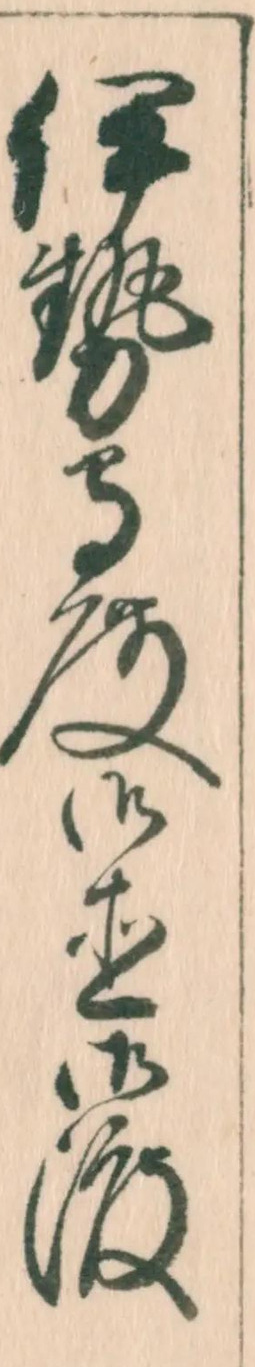│伊㔟守殿御直御渡
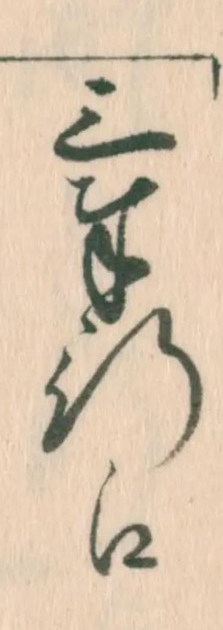│[三奉行え
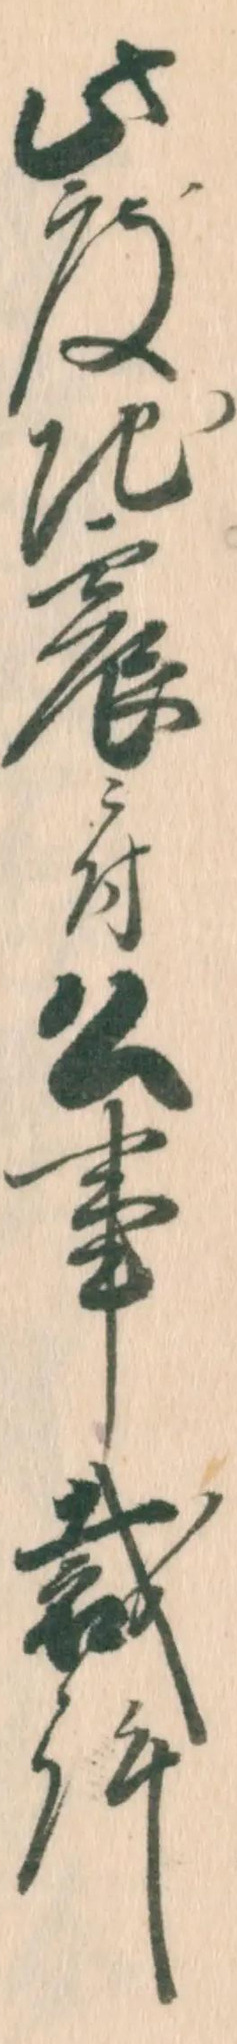此度地震ニ付、公事裁許
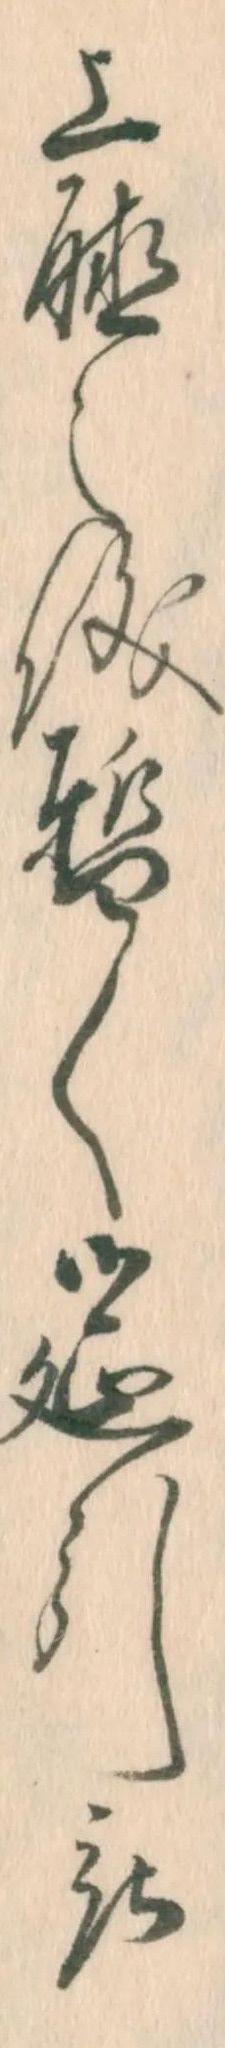上聴之儀暫く御延引被
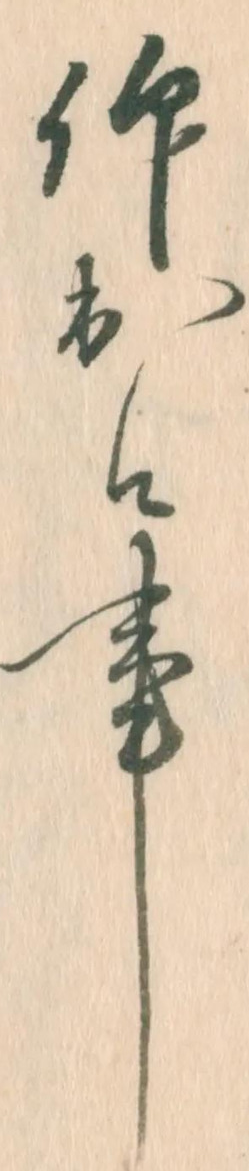仰出候事
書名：地震災書留 2巻. [2] 内表紙に「地震一件　安政二卯年十月」とあり
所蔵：国立国会図書館 National Diet Library, JAPAN
